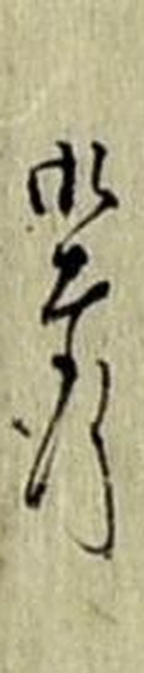御奉行
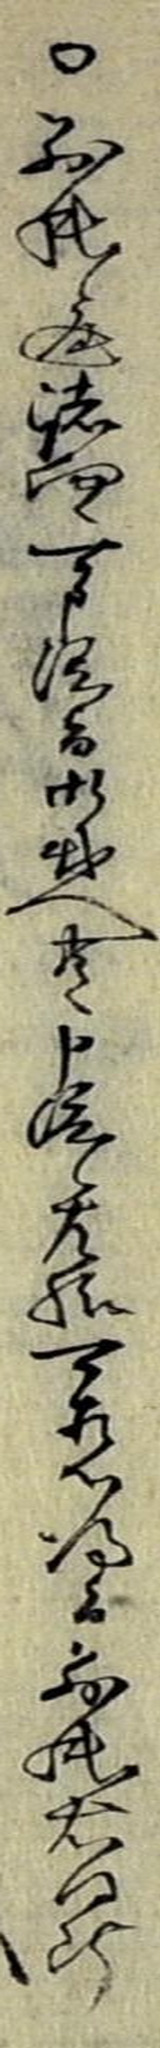○別紙之通諸向へ可申渡旨御用人共へ申渡候左様可相心得旨別紙右同断
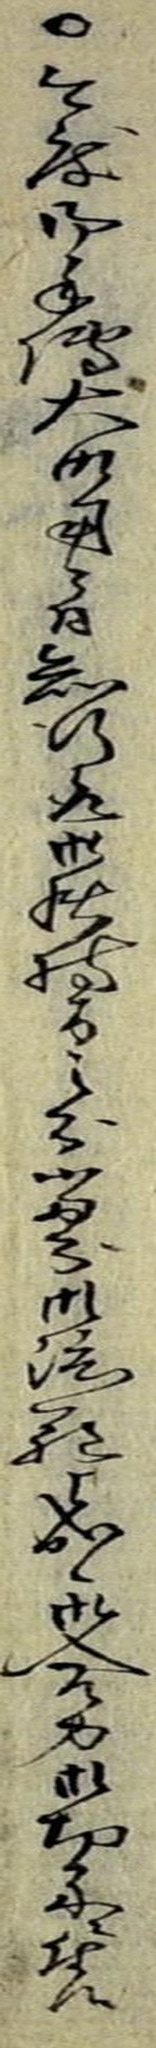○今度御手伝大御用に付知行取御扶持方之分当分御渡難被成候御合力御切米に付候
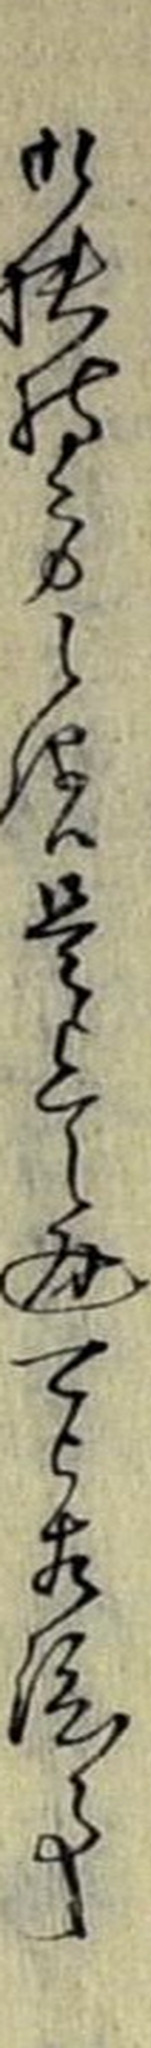御扶持方之儀は是迄之通可被相渡事
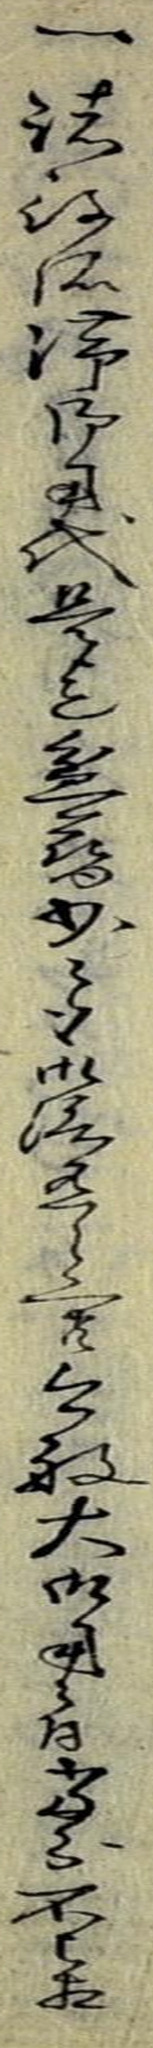一諸役所滞御用代是迄盆暮少々つヽ御渡有之候へ共今般大御用に付当分不被相
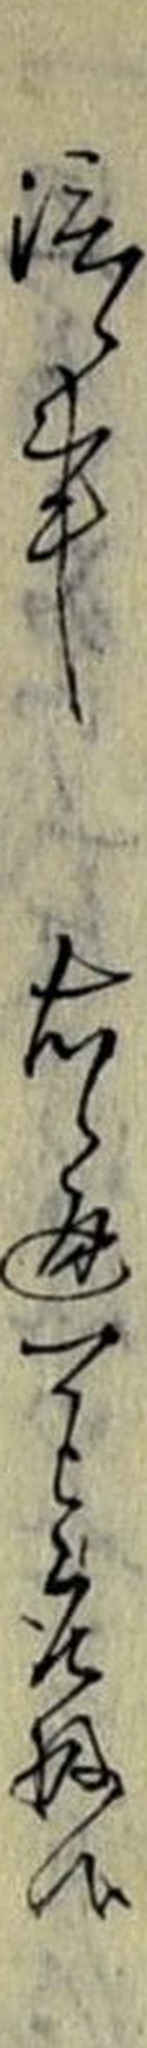渡候事右之通可被取扱候
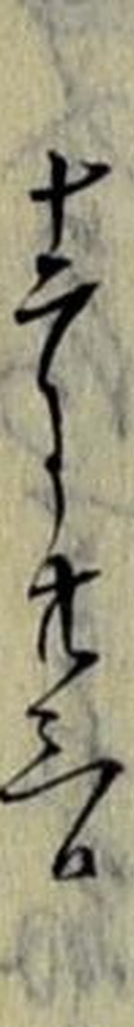十二月廿三日
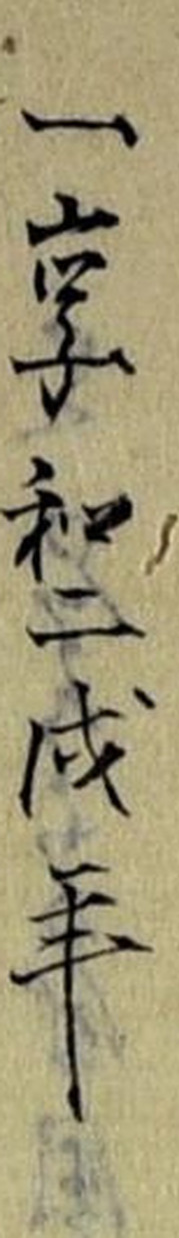一享和二戌年
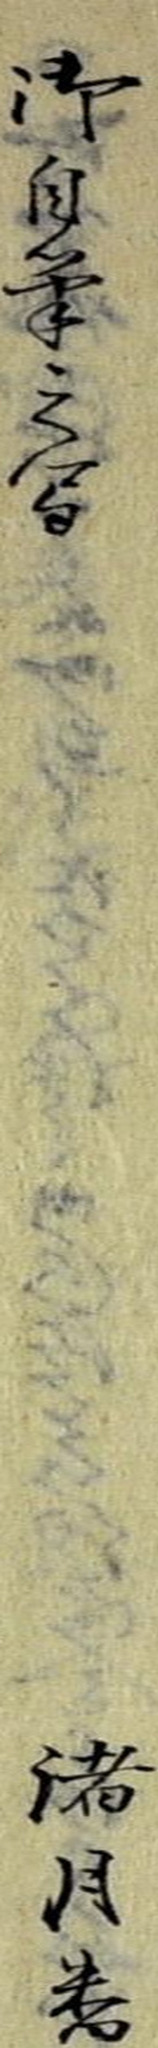御自筆之写諸月番
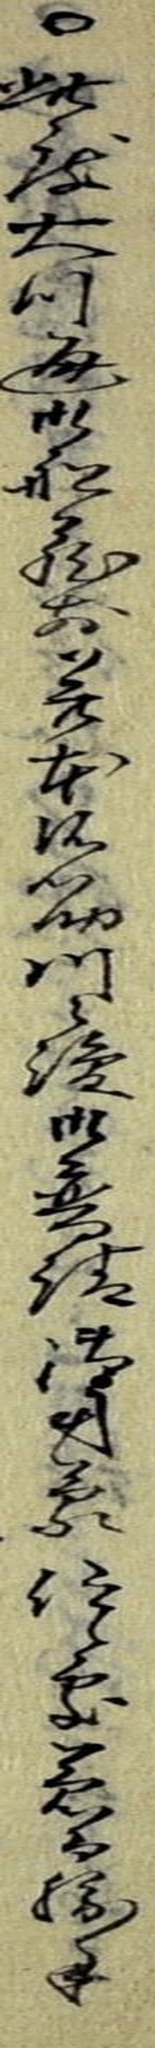○此度大川通御船蔵前并本所筋川々浚御普請御用蒙仰候処兼而勝手
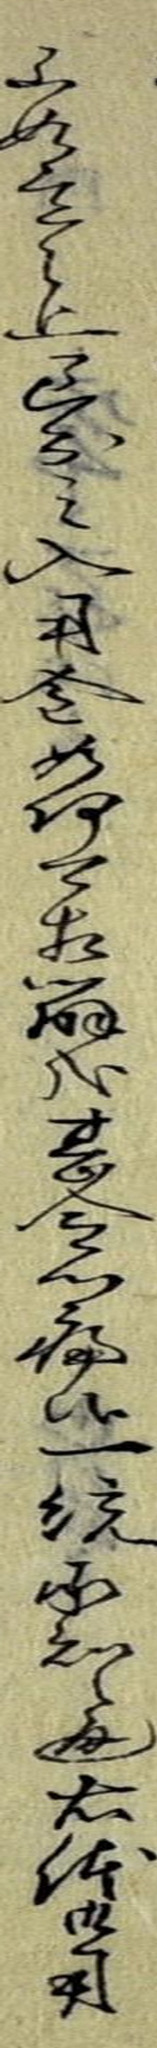不如意之上過分之入用金如何可相弁哉甚令心痛候一統承知之通右体御用
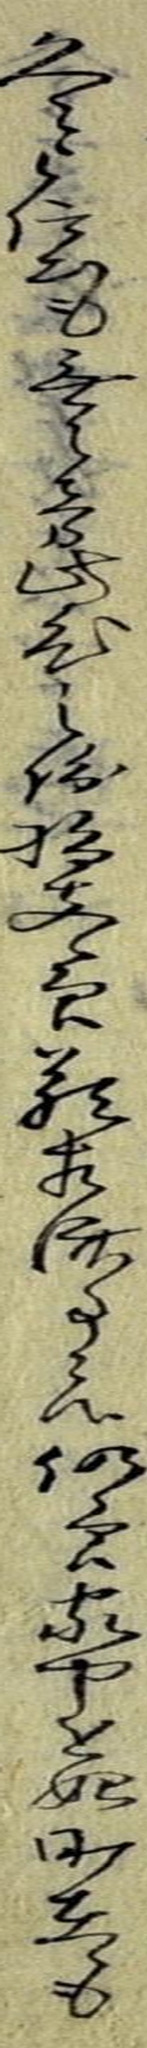久々被仰出も無之旁此度之儀指支候而は難相済事に候仍而は家中を始町在へも
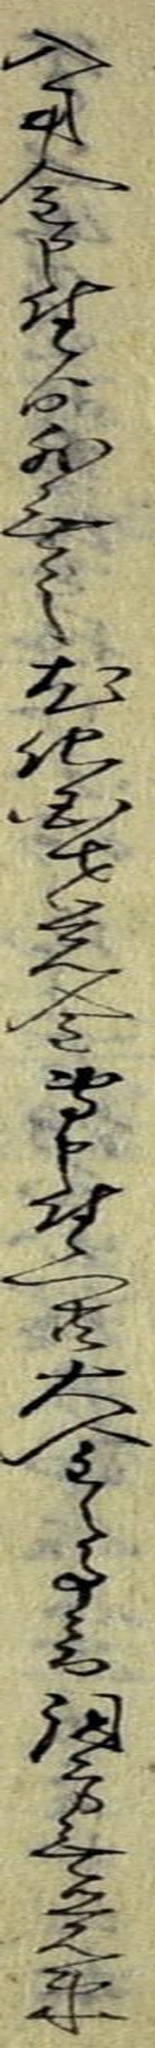入用金申付候ゟ外無之尤他国才覚金専申付候へ共大金之事に而調方無覚束
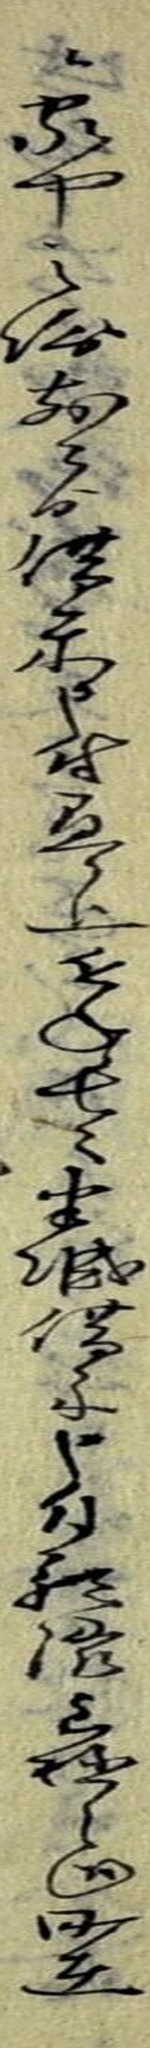候家中之儀前々ゟ借米申付置候上近年長々半減借米申付難渋至極之趣町在
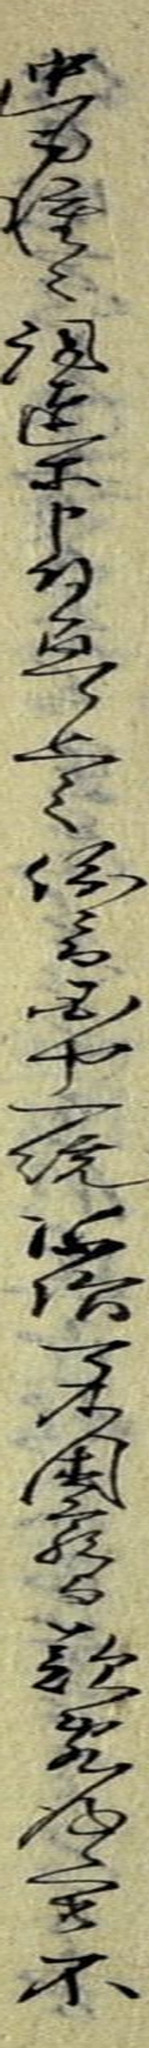迚も種々調達等申付置候上之儀に而国中一統弥増可及困窮と歎敷存候へ共不
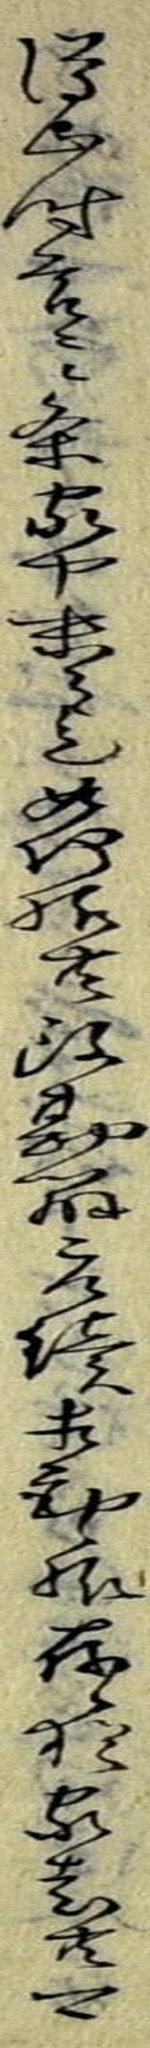得止時節に候条家中末々迄如何様共致勘弁取続相勤候様存候猶家老共可
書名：命令之部 四
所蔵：福井県文書館 Fukui Prefectural Archives
